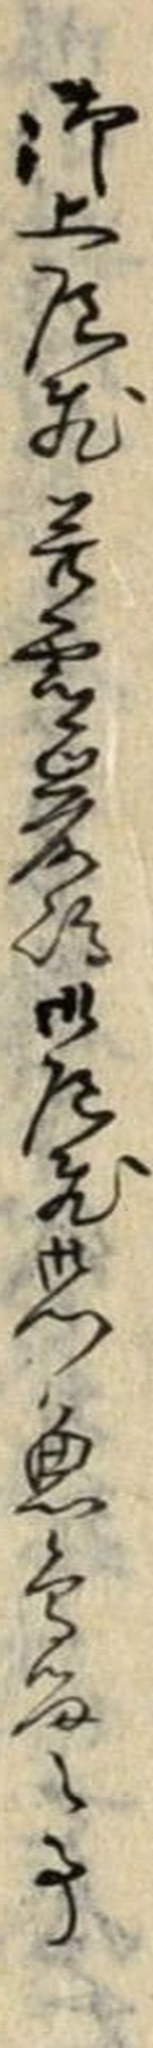御上屋敷幷霊巖嶋御屋敷御門魚鳥留候事
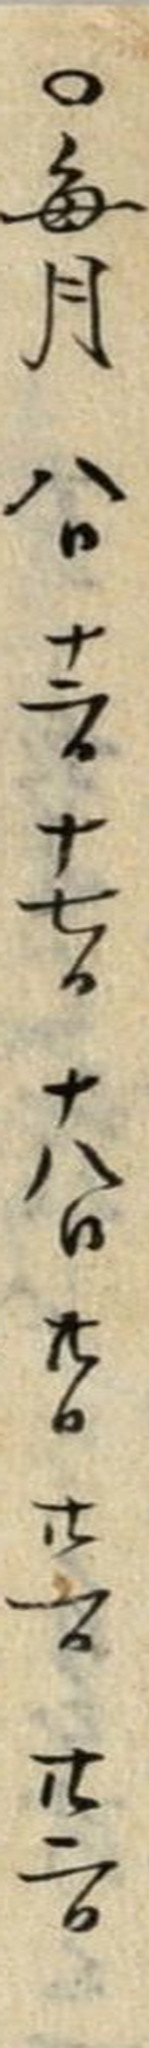〇毎月八日十二日十七日十八日廿日廿一日廿二日
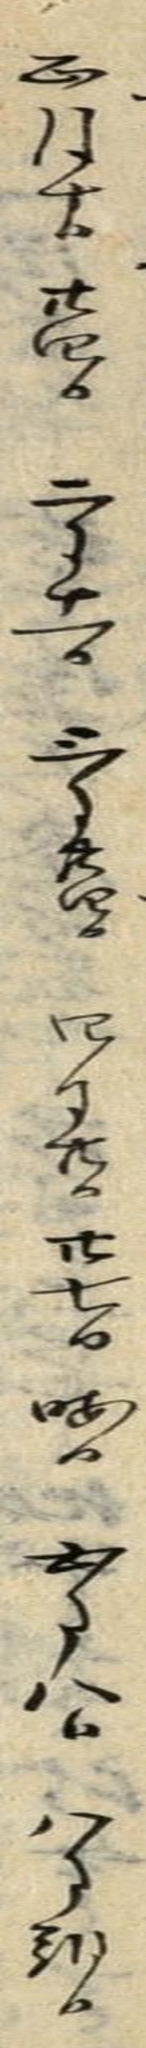正月十日廿四日二月十一日三月廿四日四月廿日廿七日晦日五月八日八月朔日
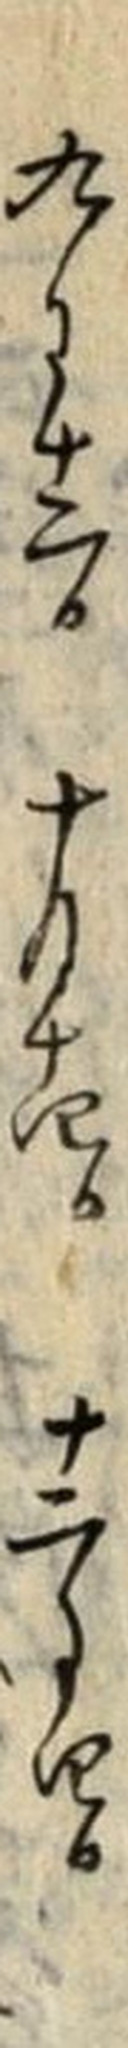九月十二日十月十四日十二月四日
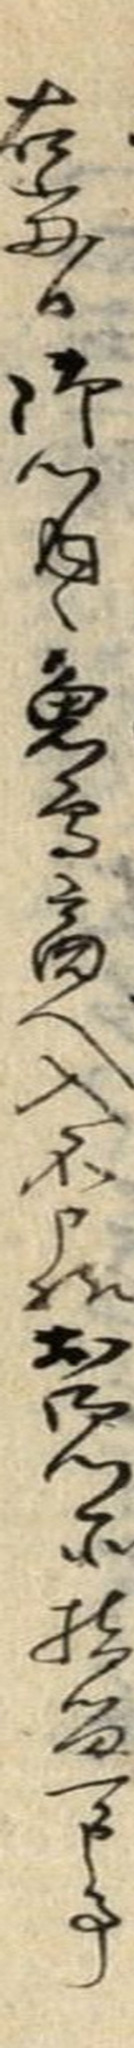右当日御門内へ魚鳥商人入不申様於御門所指留可申事
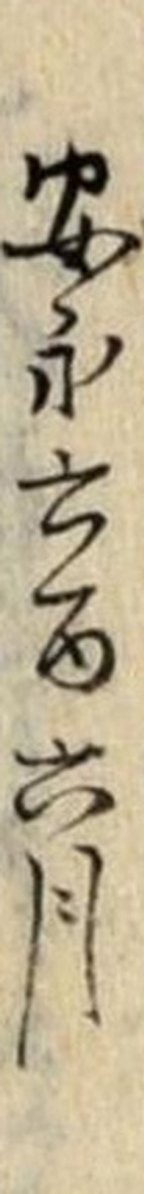安永六酉六月
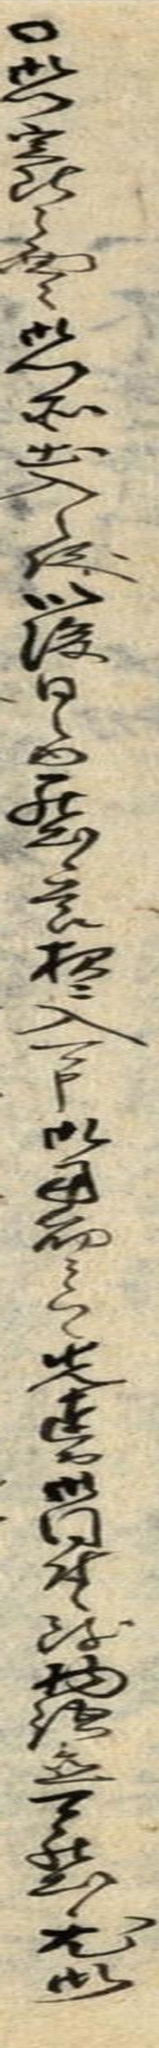〇御門定断之面々御門所出入之儀以後日之内罷出候節夜に入可申御用筋に候はゝ先達て御目付へ致物語置可罷出候尤御
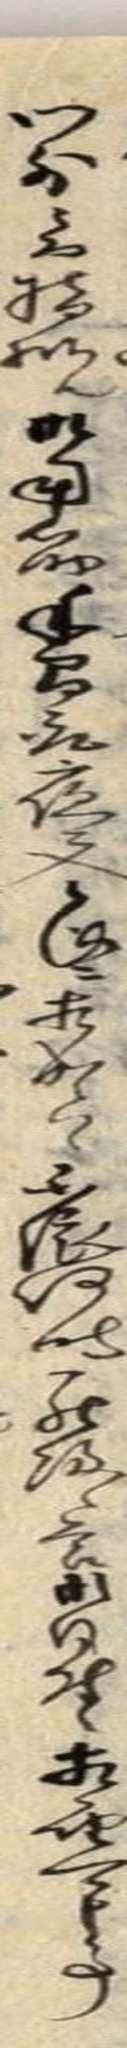門外にて指掛候御用筋手間取夜に入候趣に相成候はゝ不依何時罷帰候節御目付へ相届可申事
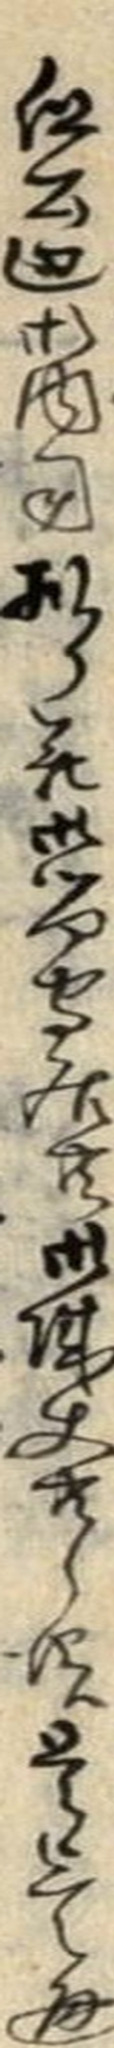但公辺御内用掛り幷御留守居共御城使共之儀は是迄之通
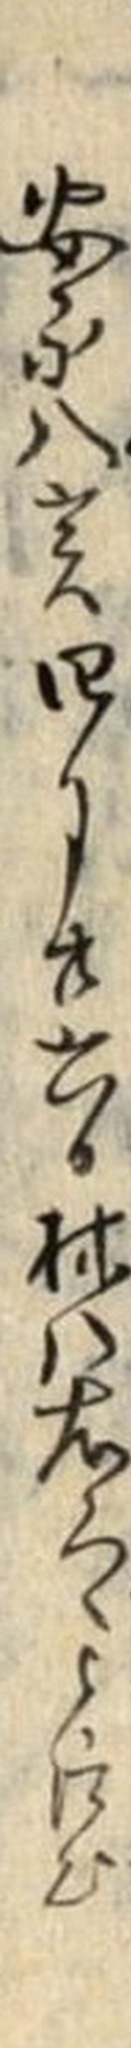安永八亥四月廿六日林八右衛門へ被仰出

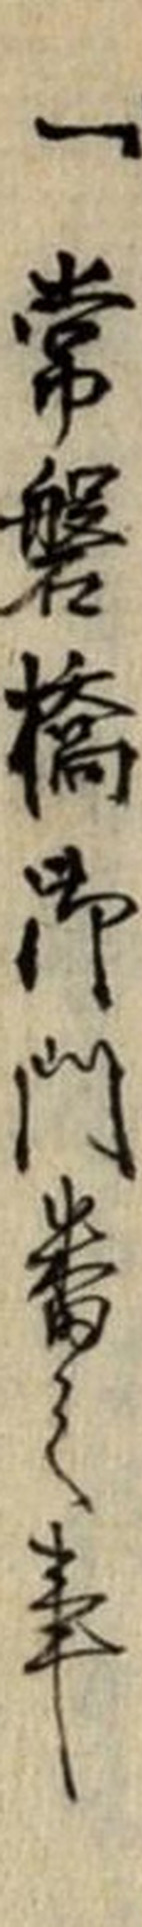一常盤橋御門番之事
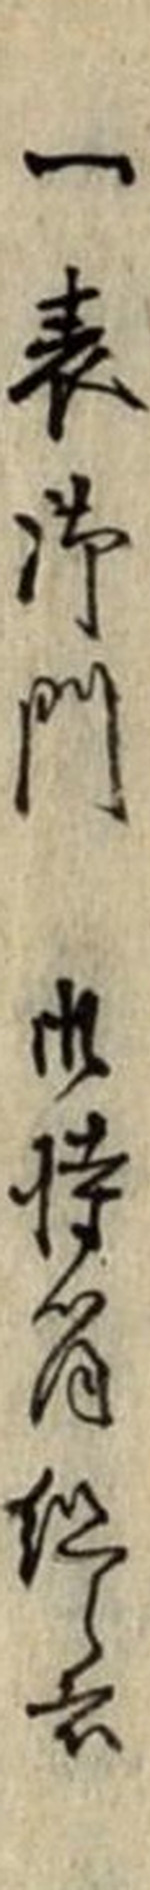一表御門御持筒組之者
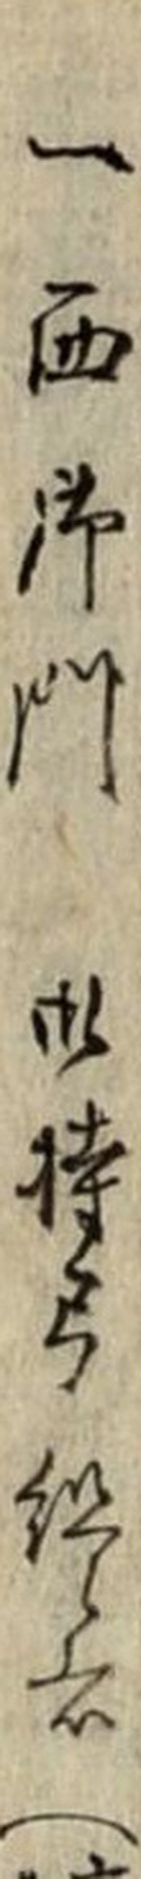一表御門御持筒組之者
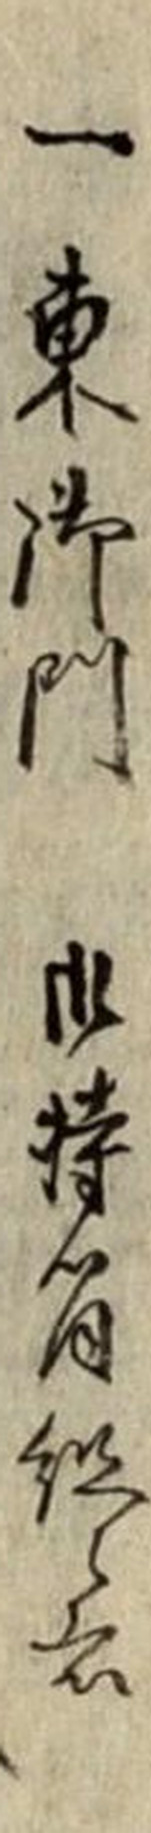一東御門御持筒組之者
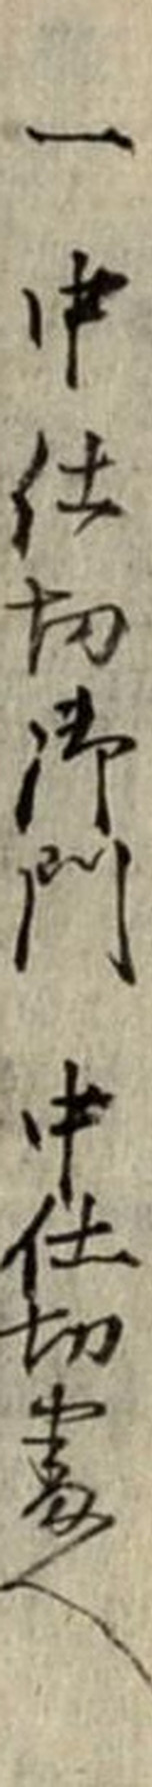一中仕切御門中仕切番人
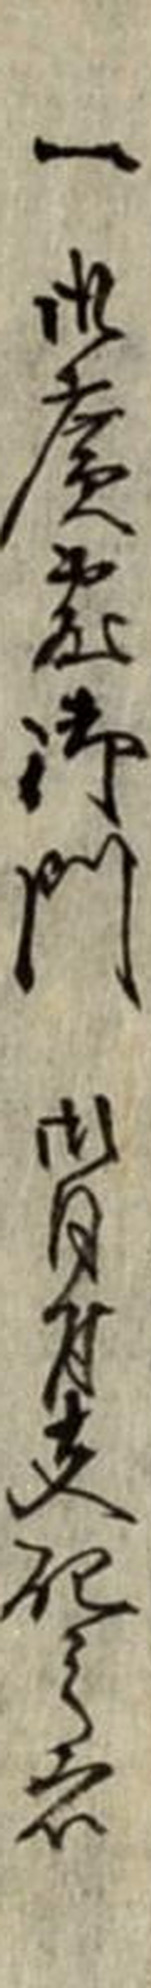一御広敷御門御目付支配之者
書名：三都并道中之部
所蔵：福井県文書館 Fukui Prefectural Archives
